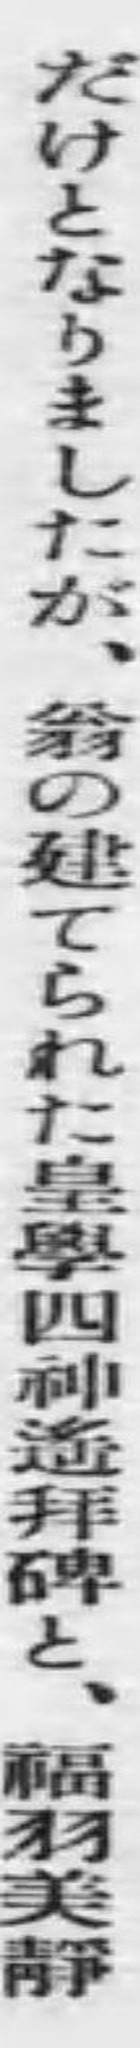だけとなりましたが、翁の建てられた皇学四神遥拝碑と、福羽美静
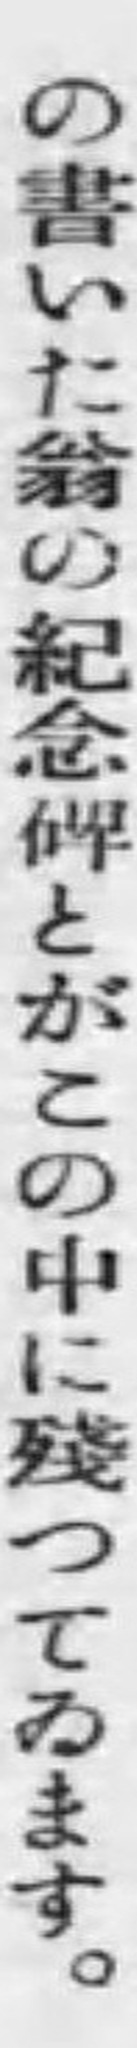の書いた翁の紀念碑とがこの中に残つてゐます。
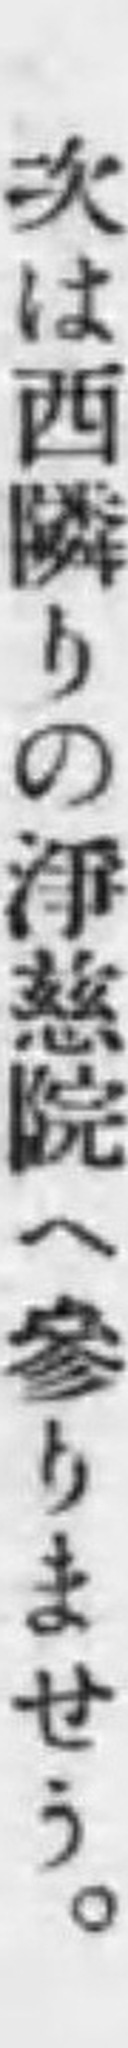次は西隣りの浄慈院へ参りませう。
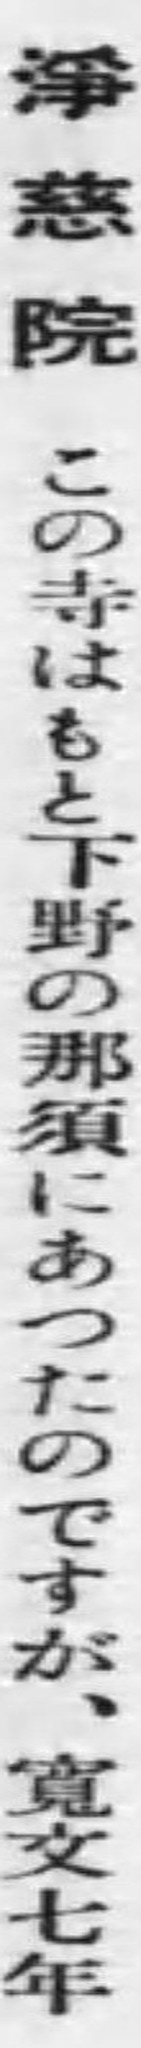浄慈院この寺はもと下野の那須にあつたのですが、寛文七年
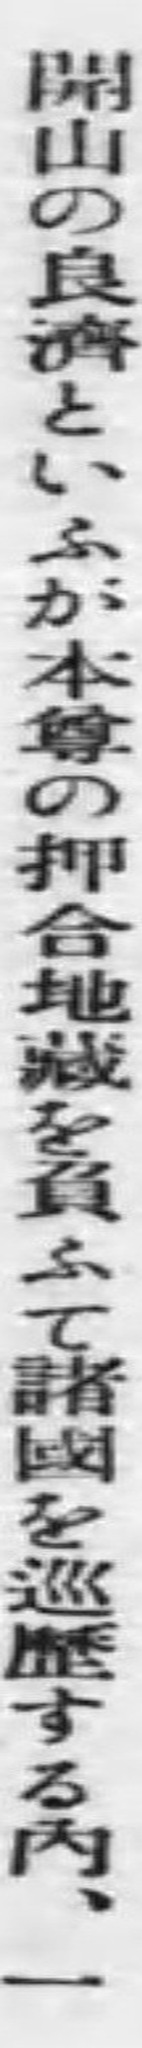開山の良済といふが本尊の押合地蔵を負ふて諸国を巡歴する内、一
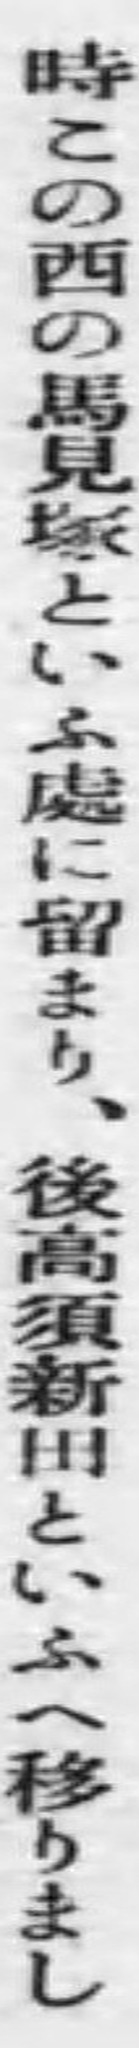時この西の馬見塚といふ処に留まり、後高須新田といふへ移りまし
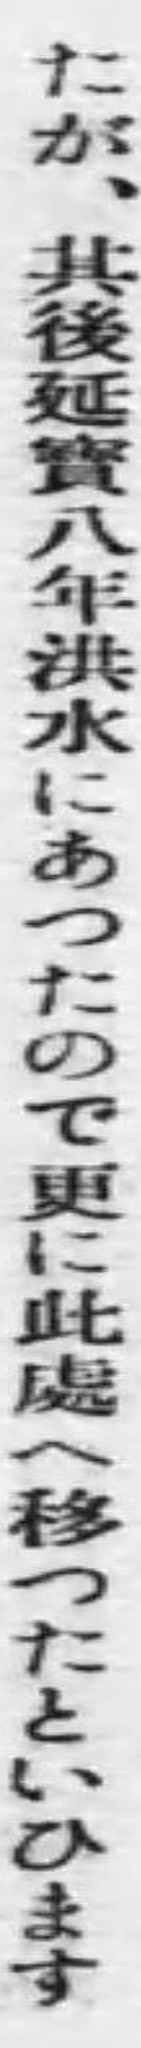たが、其後延宝八年洪水にあつたので更に此処へ移つたといひます
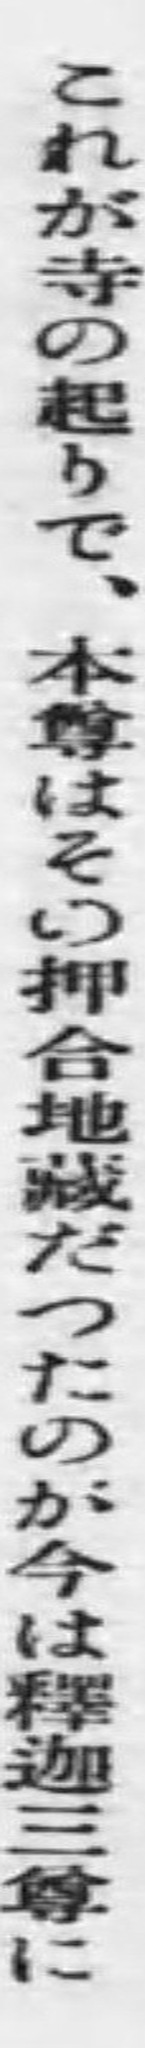これが寺の起りで、本尊はその押合地蔵だつたのが今は釈迦三尊に
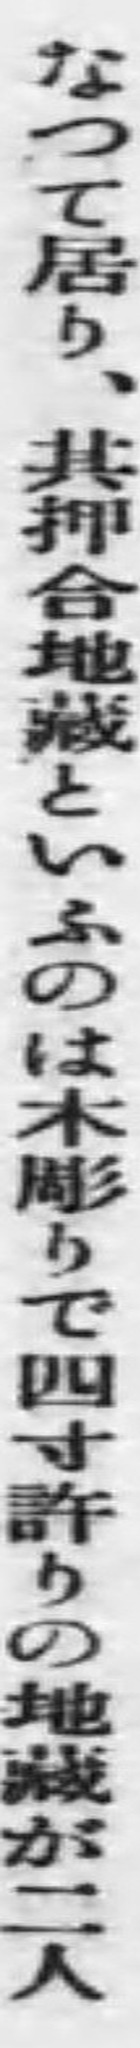なつて居り、其押合地蔵といふのは木彫りで四寸許りの地蔵が二人
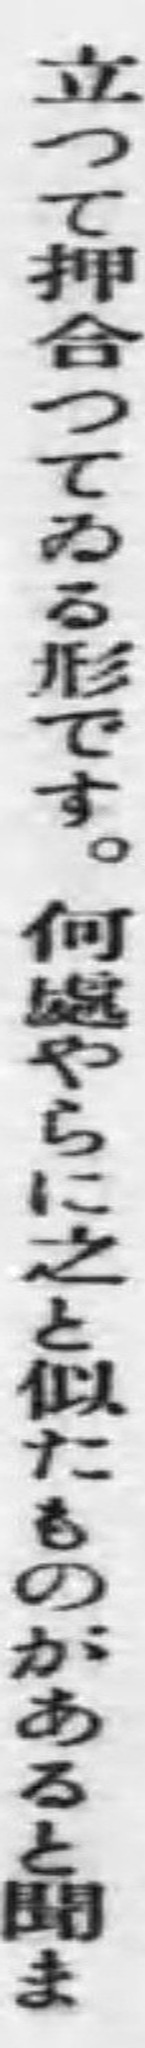立つて押合つてゐる形です。何処やらに之と似たものがあると聞ま
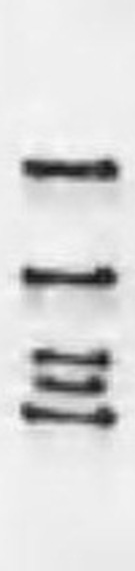一一三

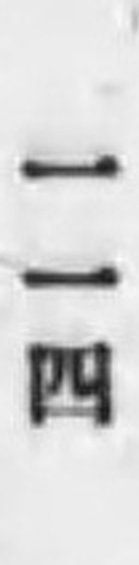一一四
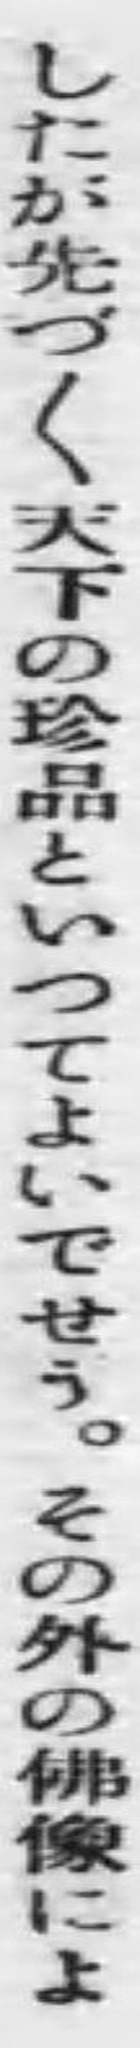したが先づ〳〵天下の珍品といつてよいでせう。その外の仏像によ
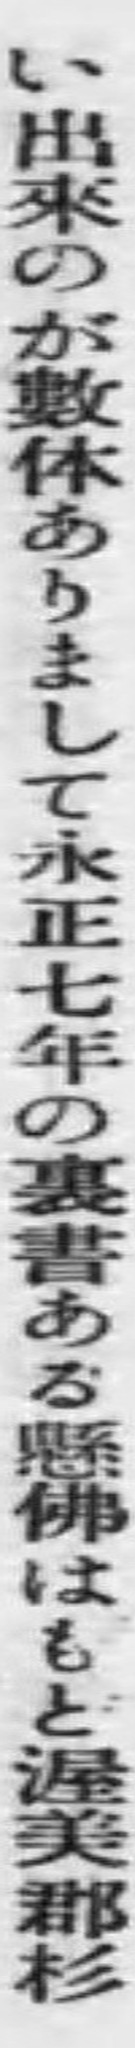い出来のが数体ありまして永正七年の裏書ある懸仏はもと渥美郡杉
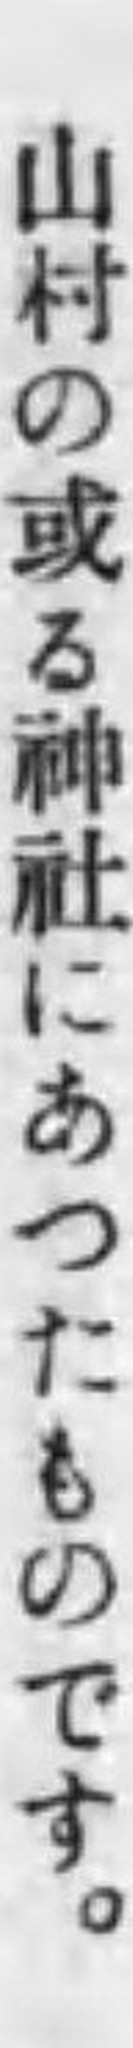山村の或る神社にあつたものです。
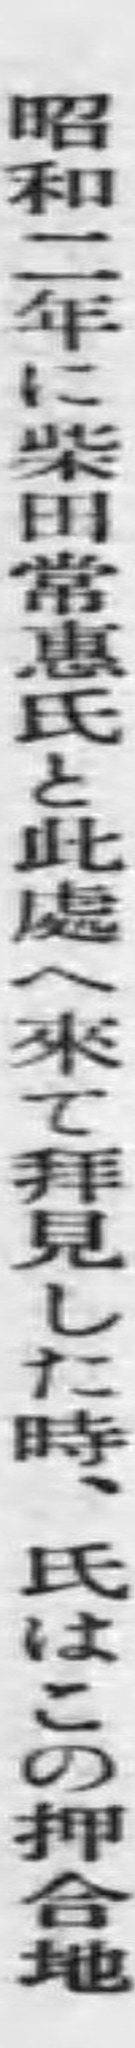昭和二年に柴田常恵氏と此処へ来て拝見した時、氏はこの押合地
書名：東三河道中記 : 豊橋市及其附近案内
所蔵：国立国会図書館 National Diet Library, JAPAN
